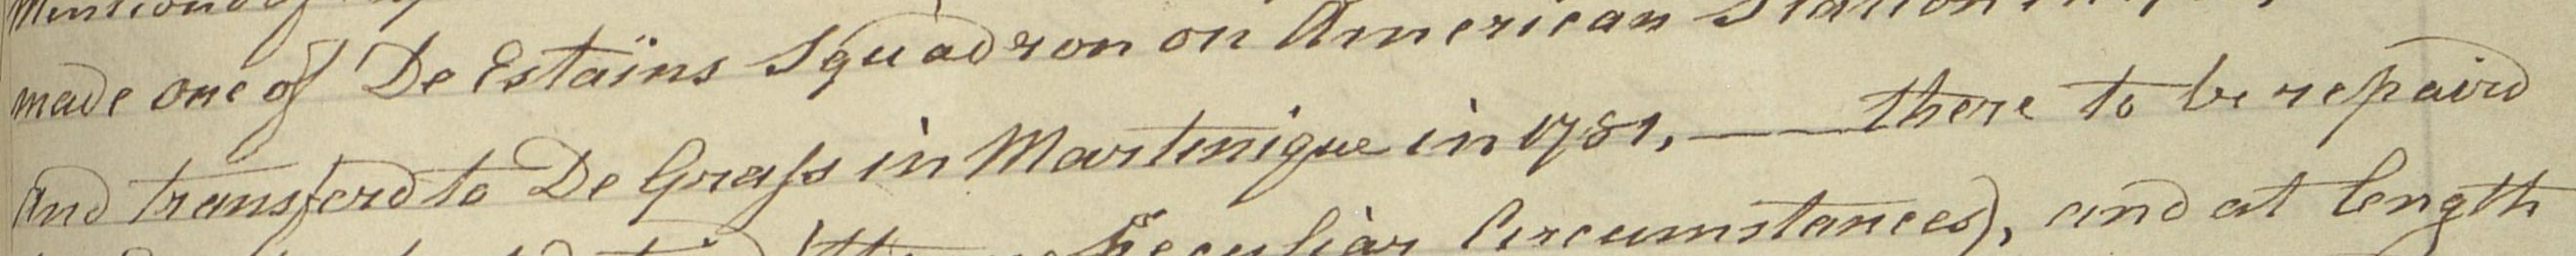and transferd to De Grass in Martinique in 1781, there to be repaird
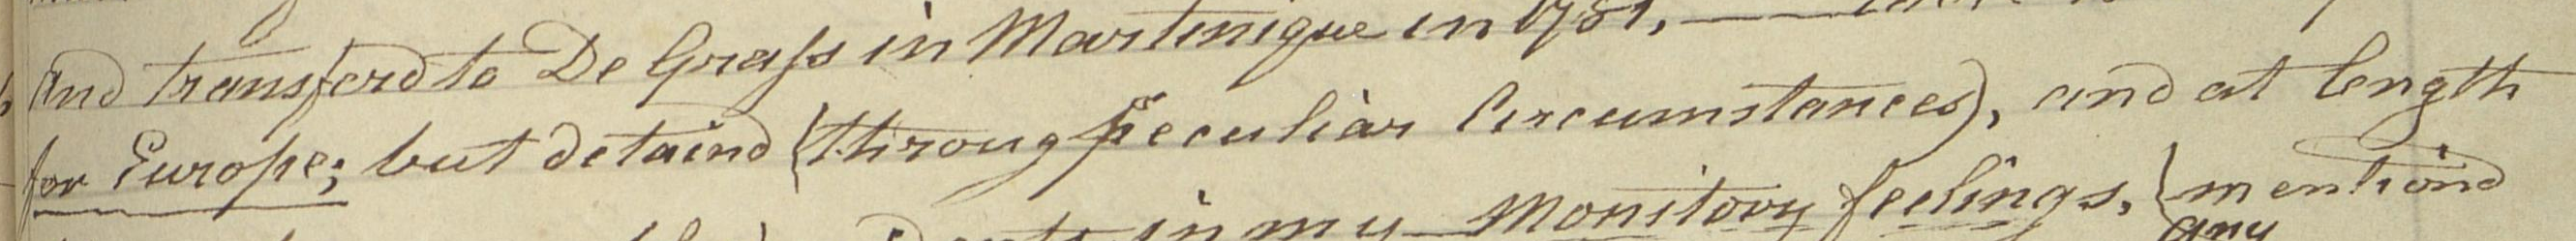for Europe; but detaind (throug peculair Circumstances), and at length
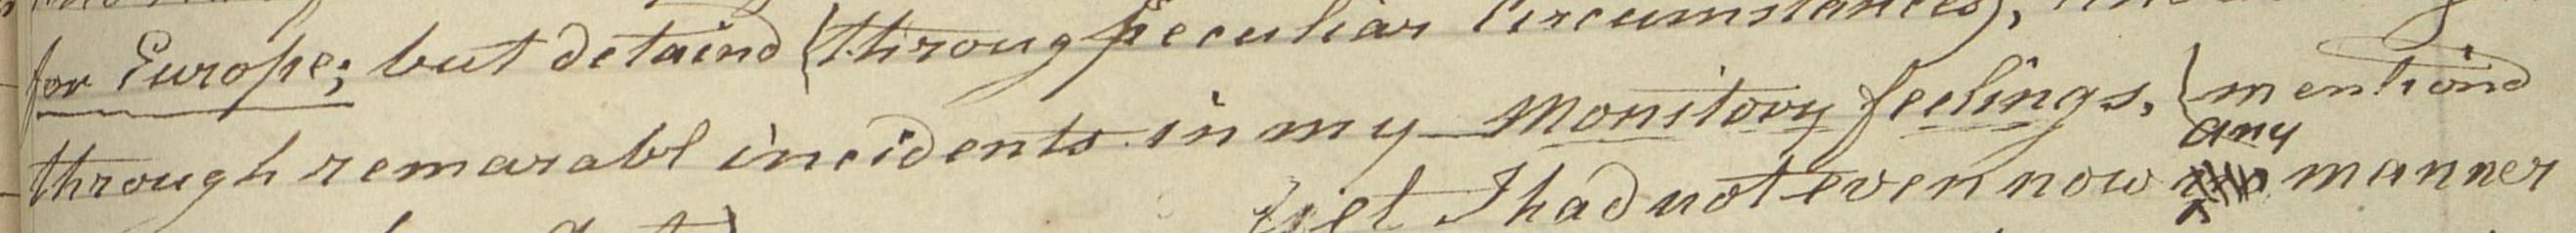through remarabl incidents in my monitory feelings, (mentiond
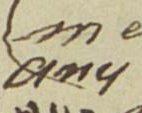any
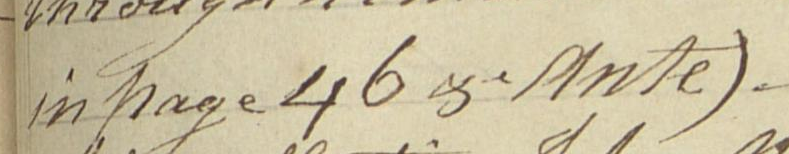in page 46 &^c Ante)
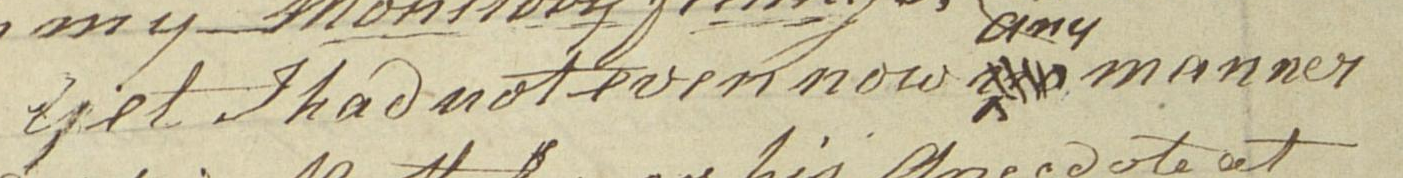yet I had not even now ^ [no] manner
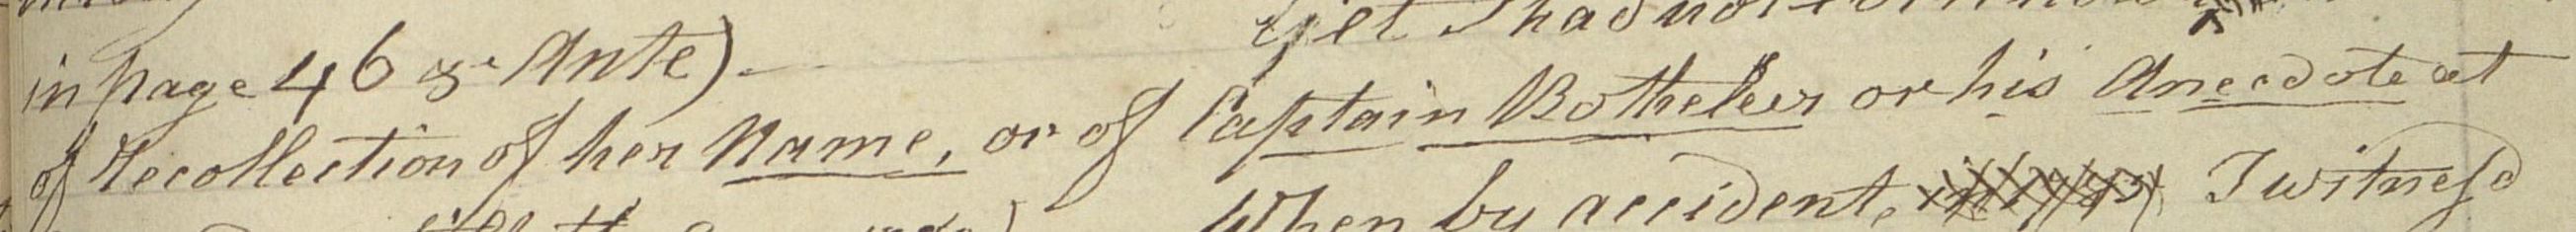of Recollection of her Name, or of Captain Bothelier or his Anecdote at
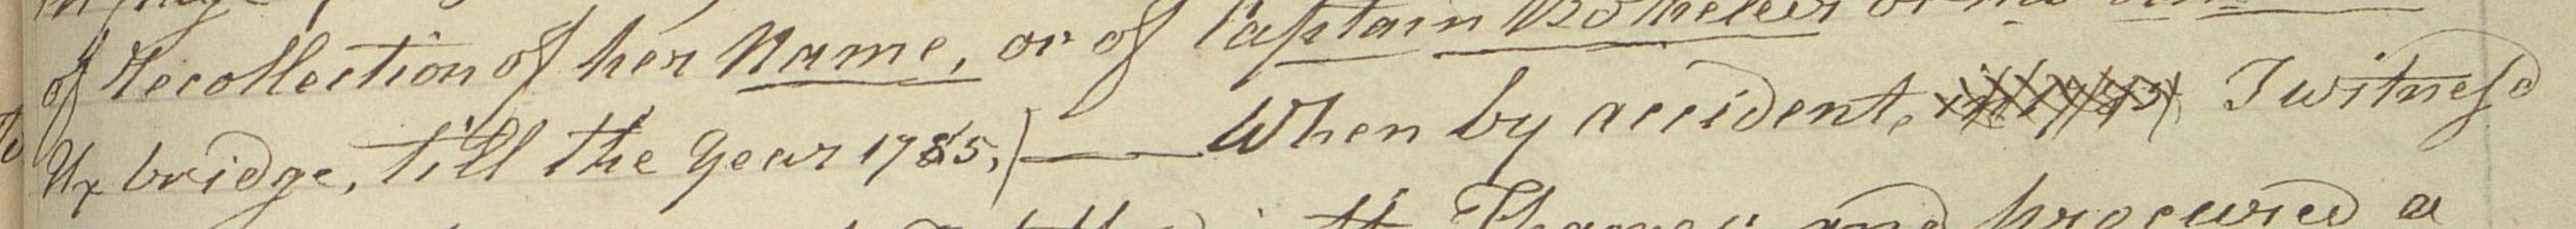Uxbridge, till the Year 1785,) When by Accident, [in 1783] I witnesd
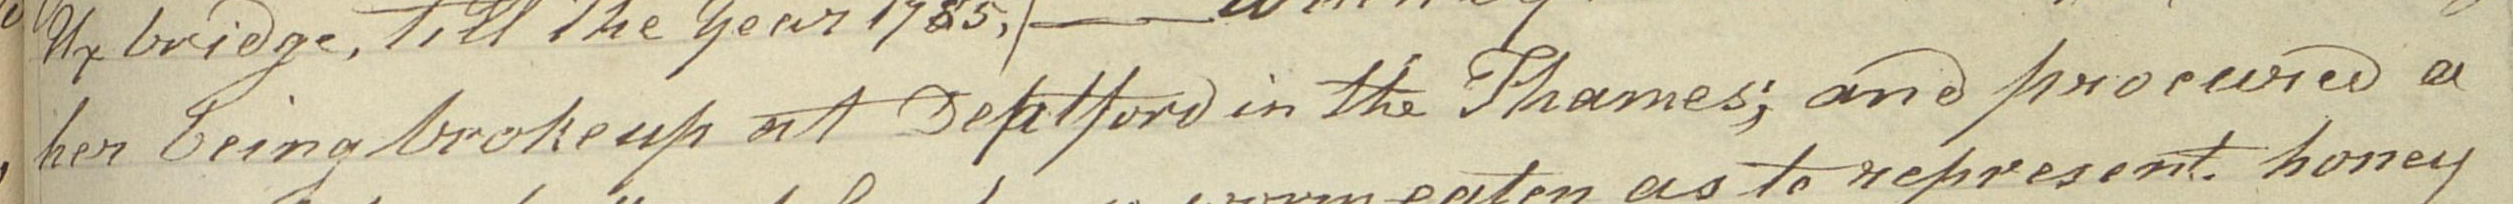her being broke up at Deptford in the Thames; and procured a
